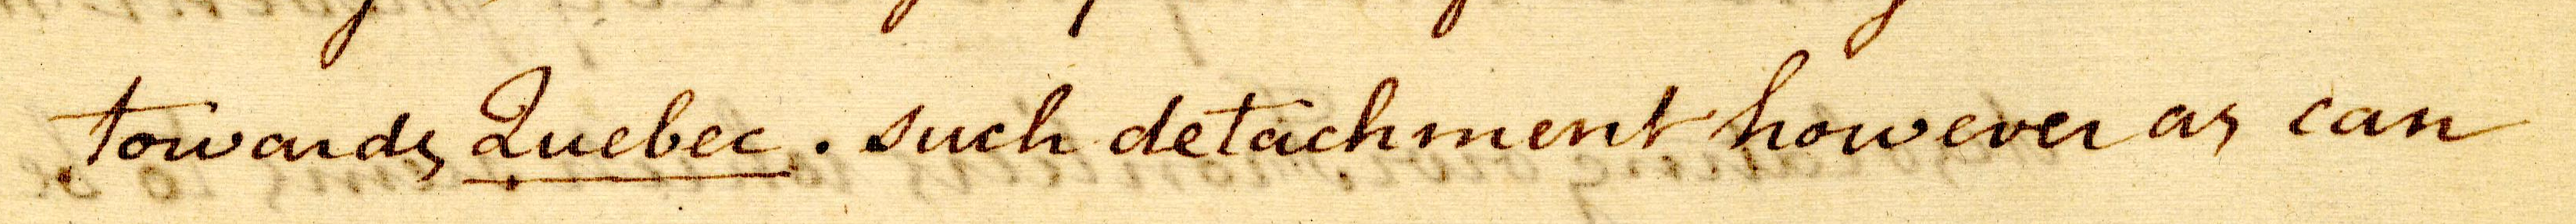towards Quebec. such detachment however as can
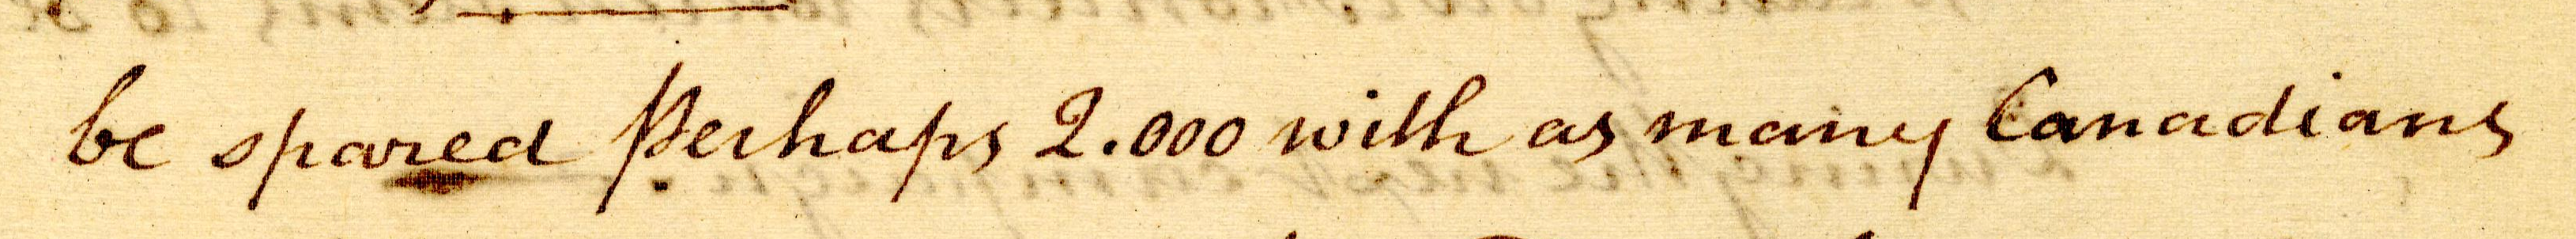be spared Perhaps 2.000 with as many Canadians
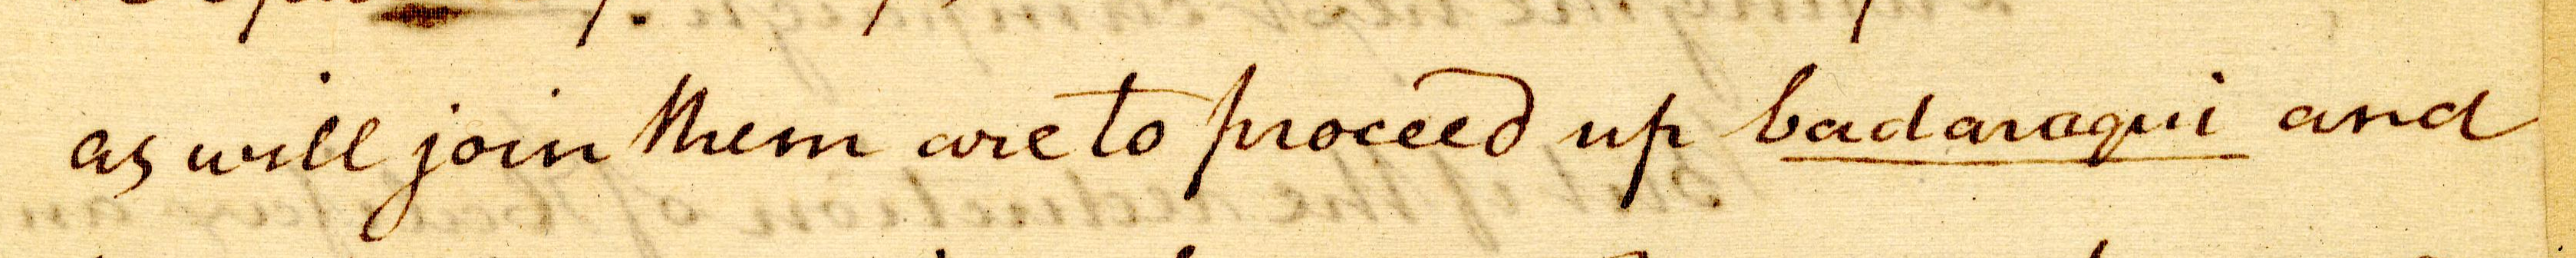as will join them are to proceed up badaraqui and
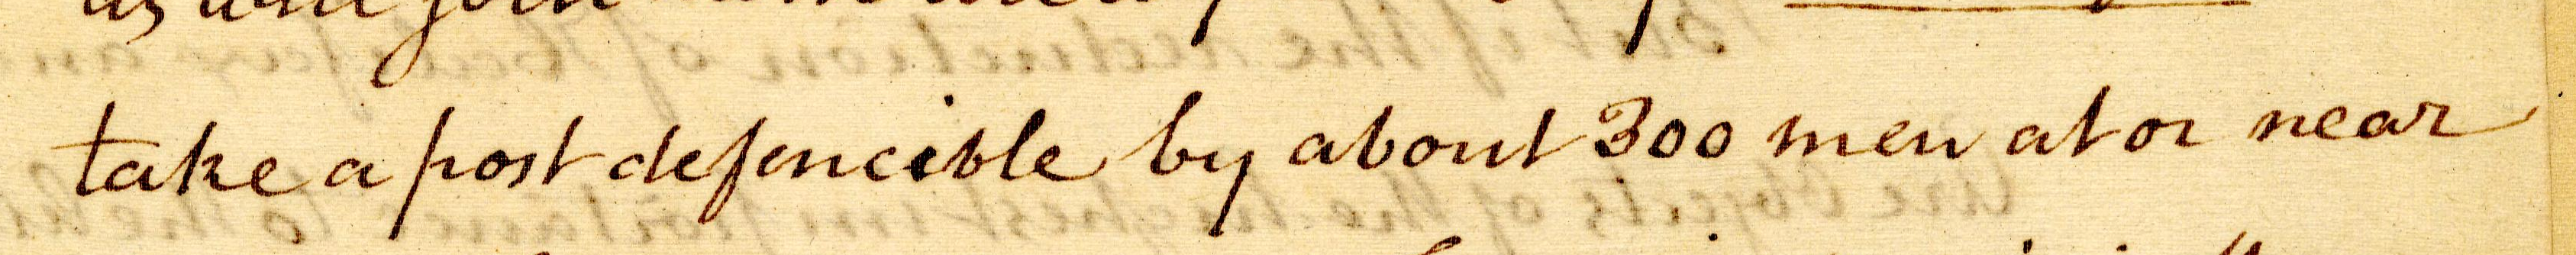take a post defencible by about 300 men at or near
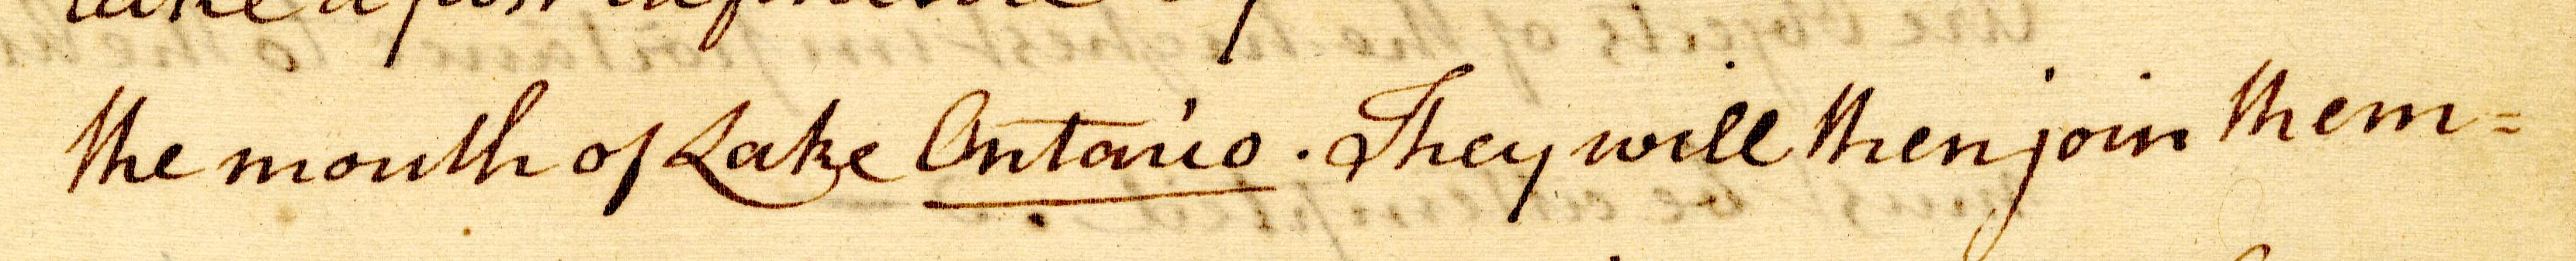the mouth of Lake Ontario. They will then join them-
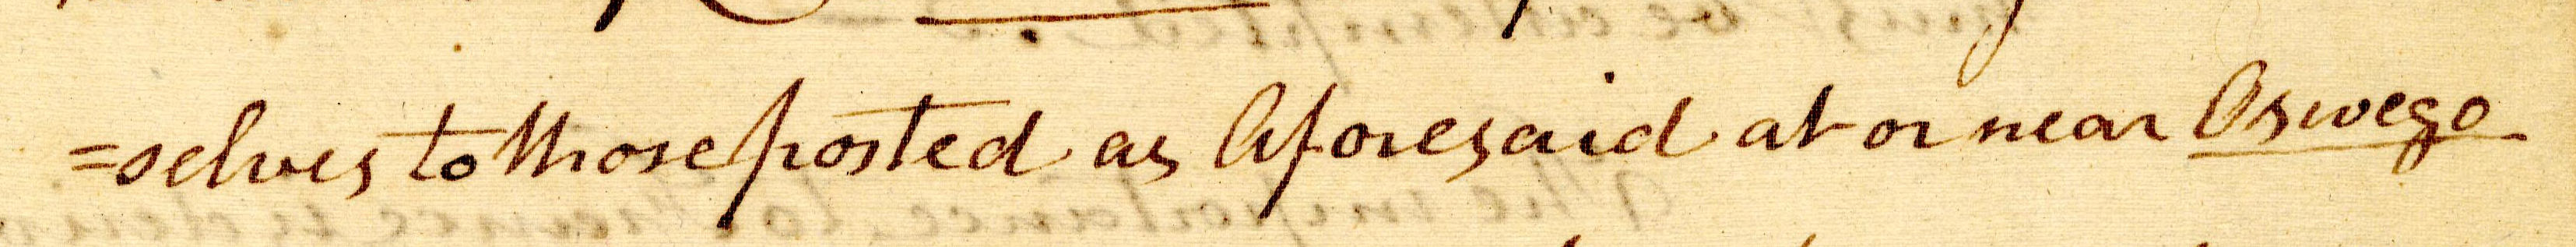-selves to those posted as Aforesaid at or near Oswego
